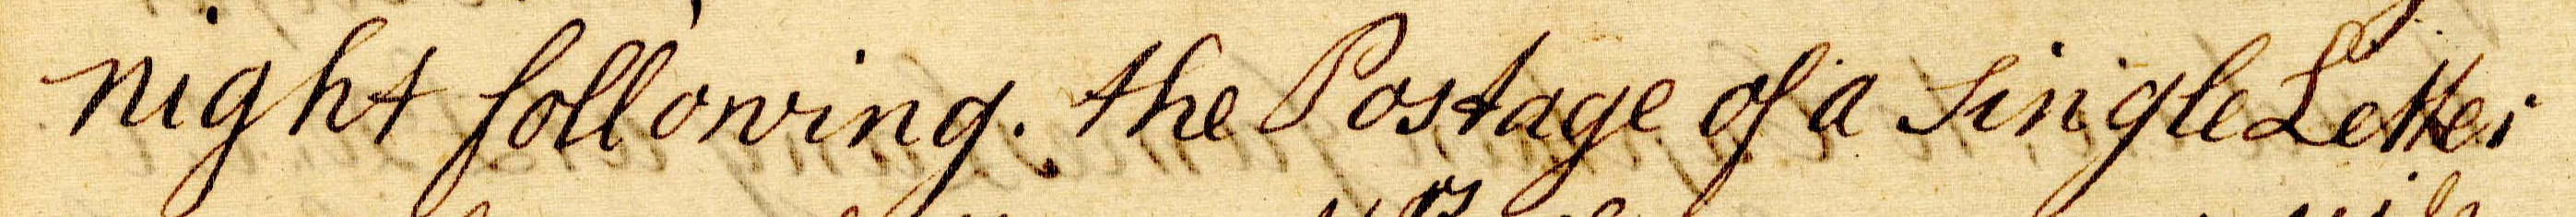night following. the Postage of a Single Letter
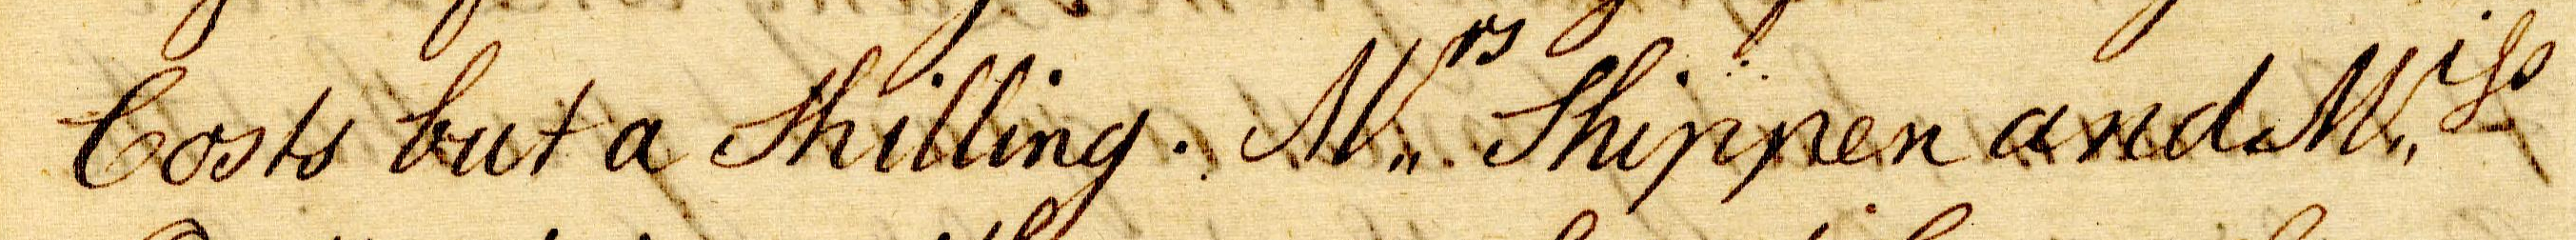Costs but a Shilling. M^rs. Shippen and M^iss.
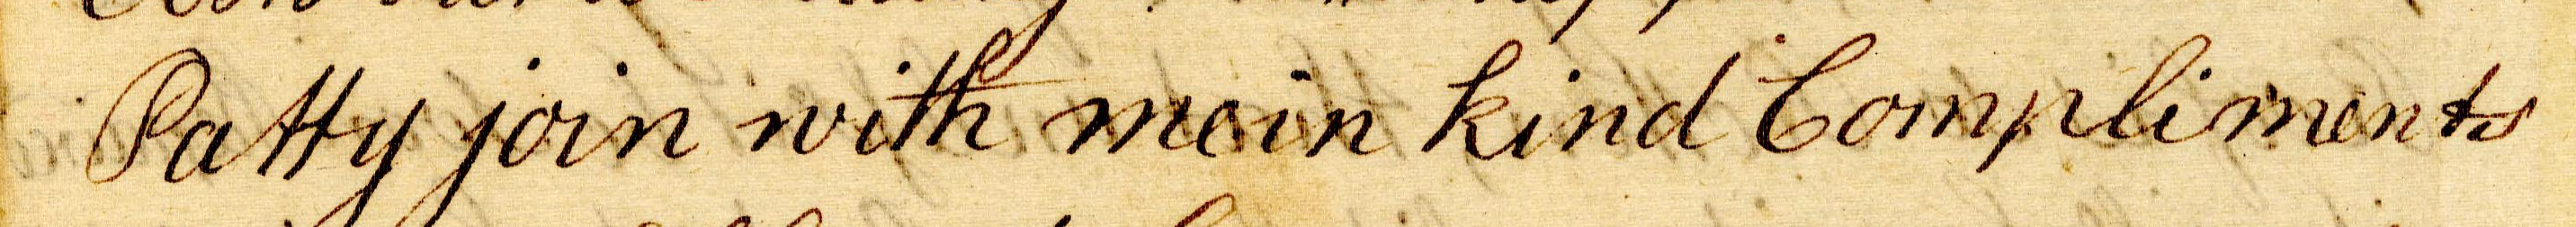Patty join with me in kind Compliments
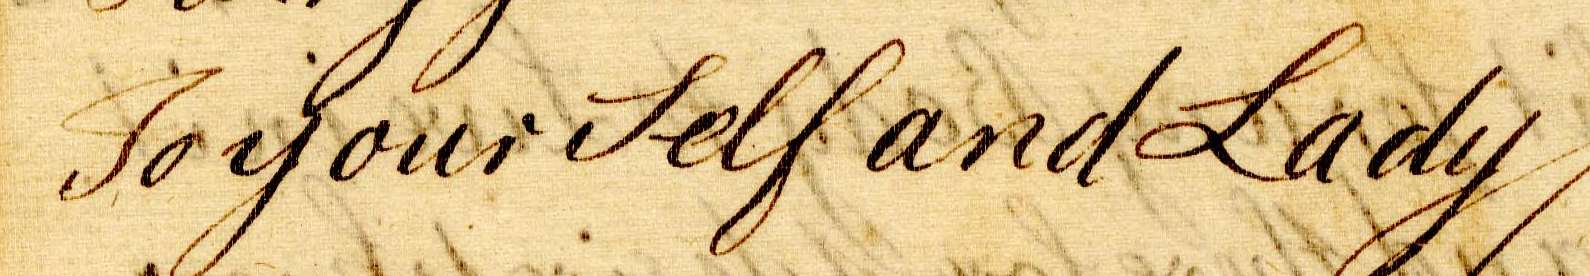To your Self and Lady
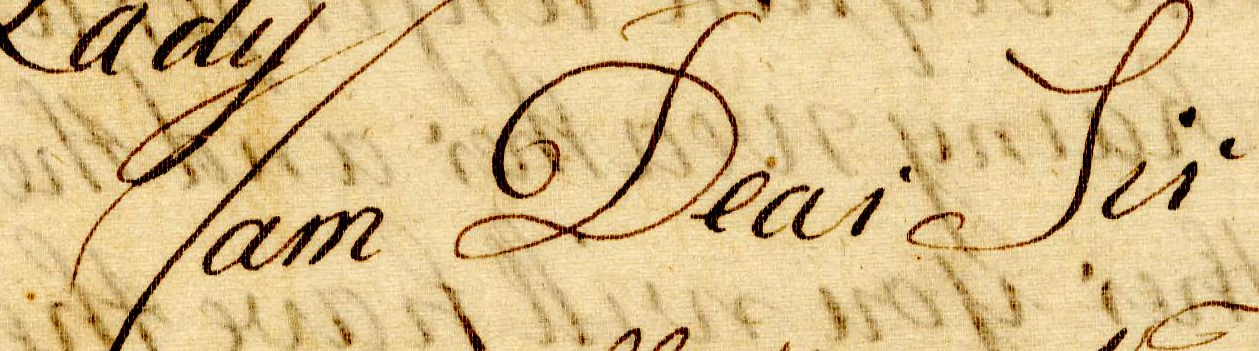I am Dear Sir
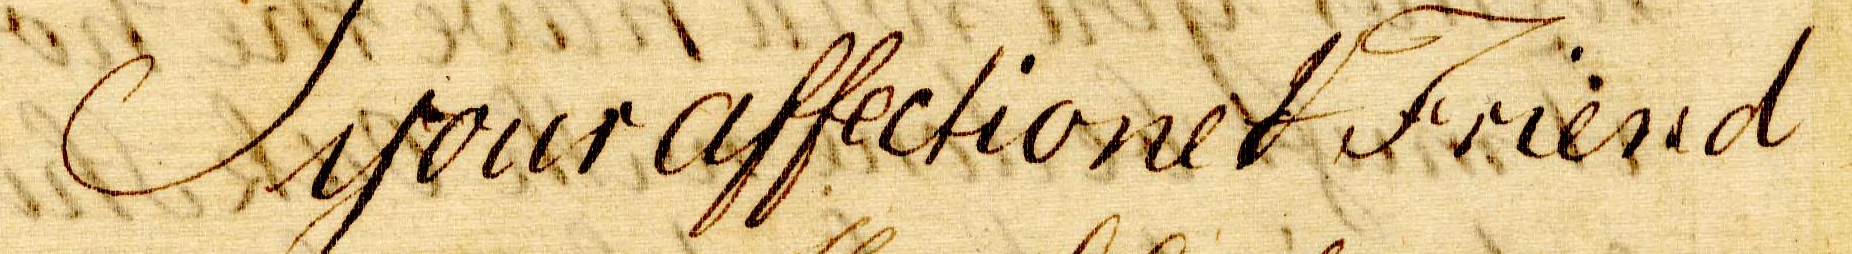Your affectionet Friend
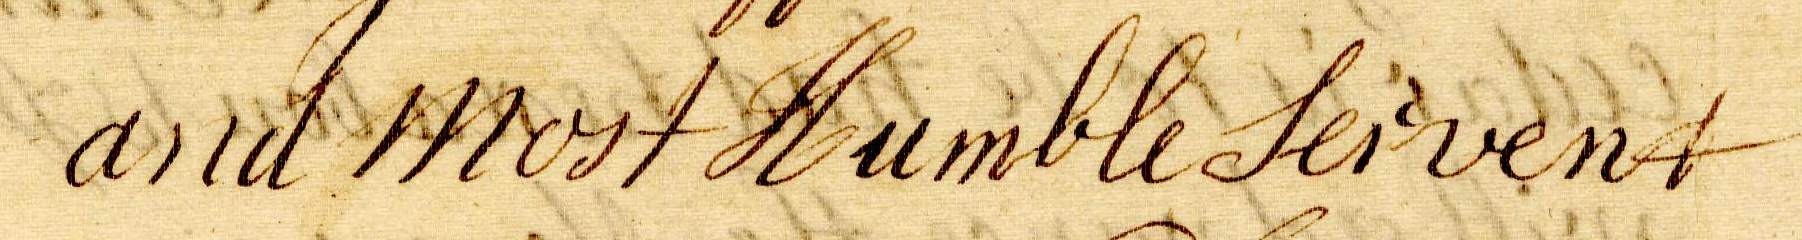and Most Humble Servent
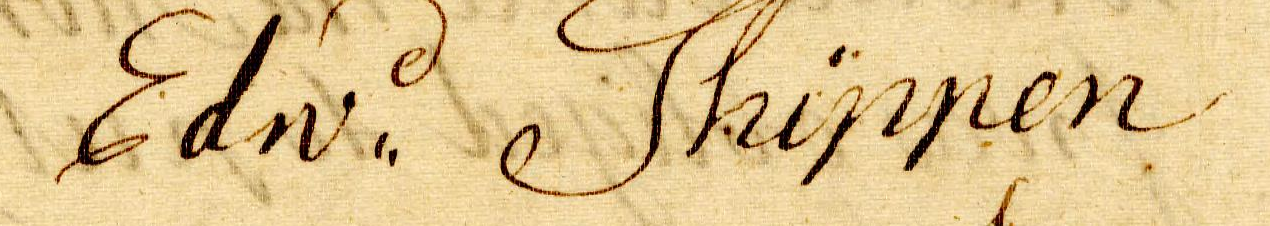Edw^d. Shippen
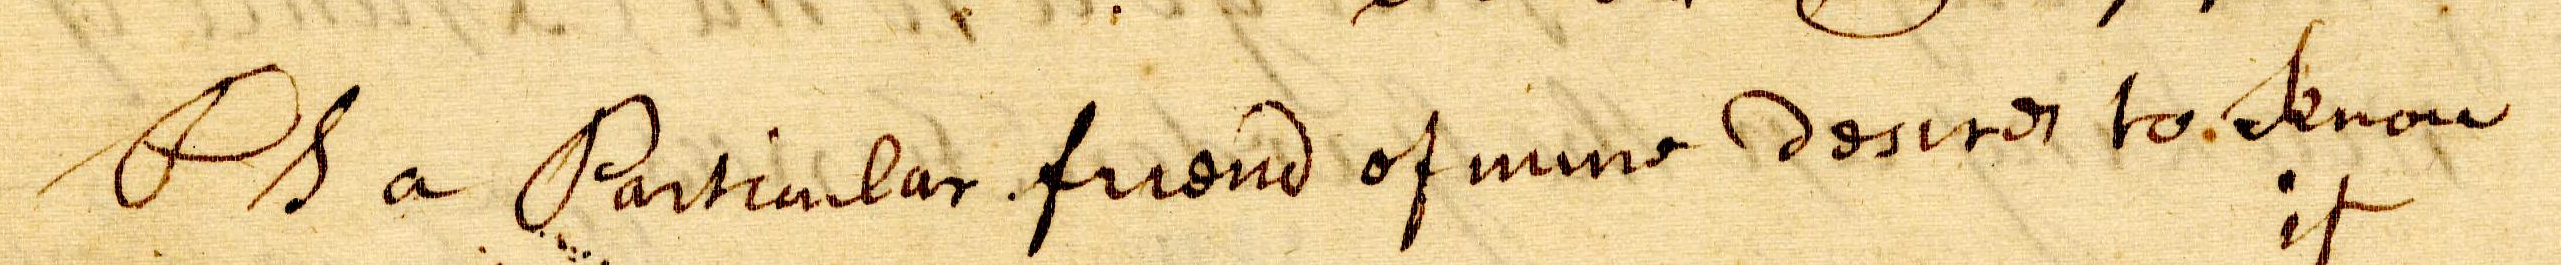PS a Particular friend of mine desires to know
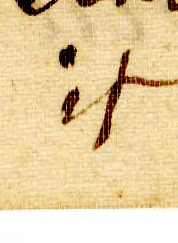if
